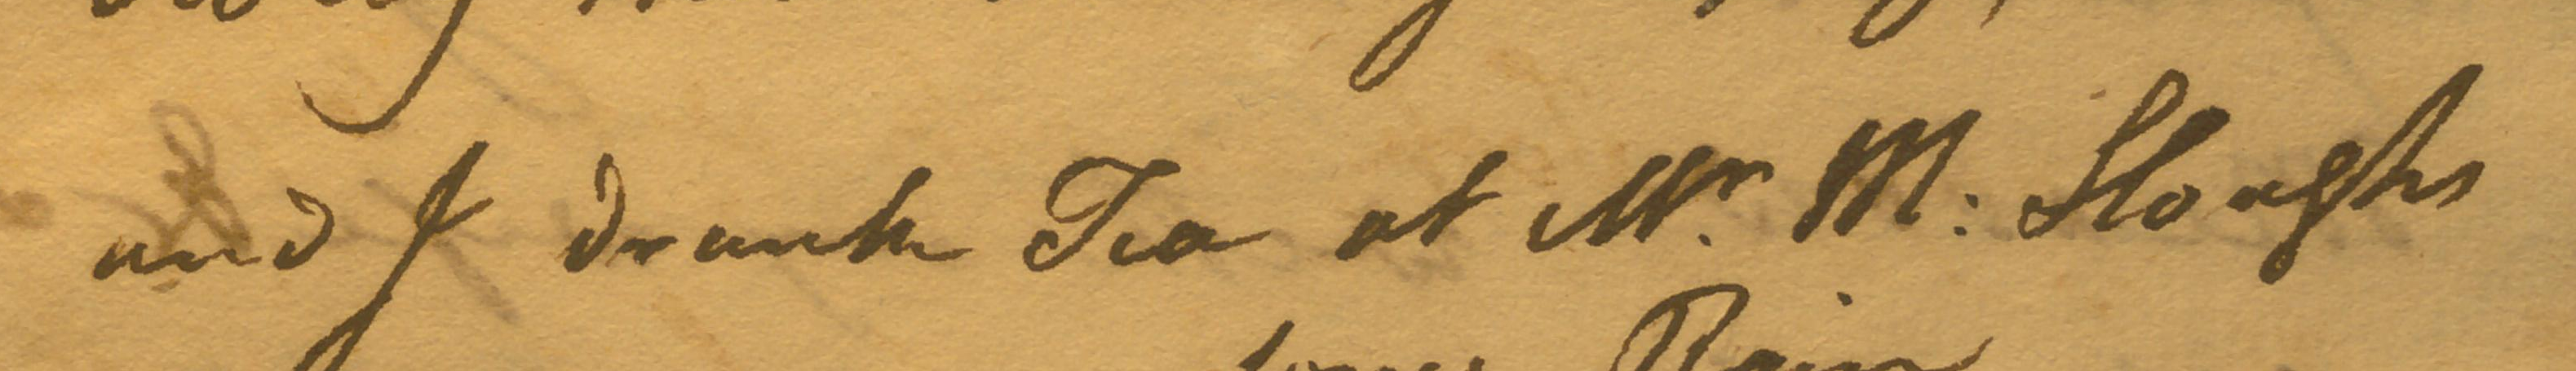and I drank Tea at M^r. M. Sloughs
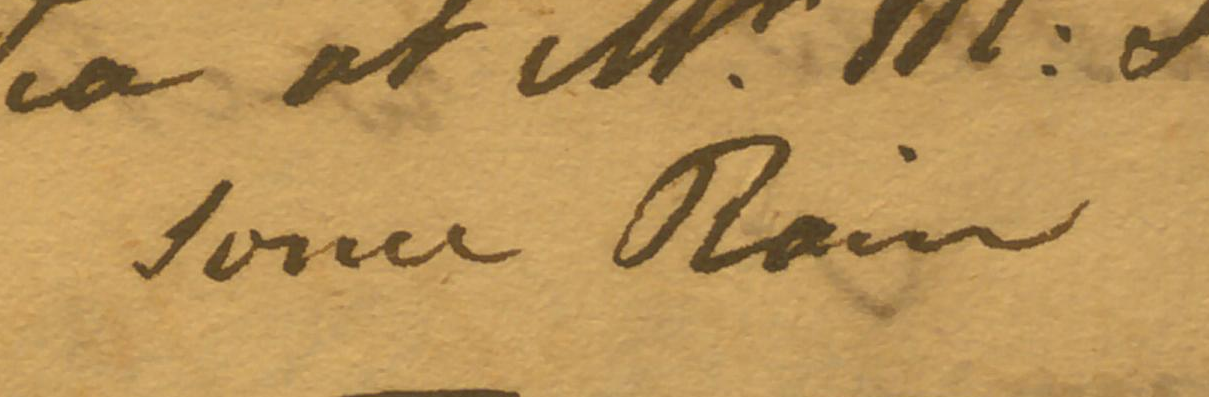some Rain
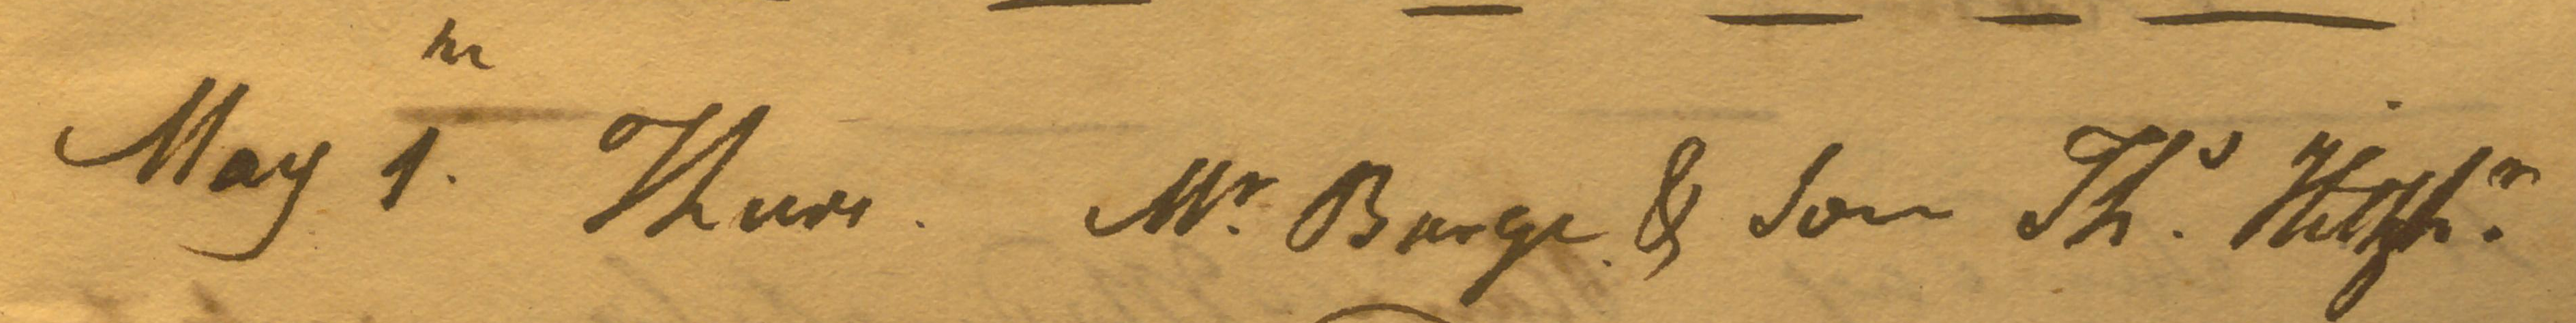May 1^th. Thurs. M^r. Barge & Son Th^s. Hiltzh^r.
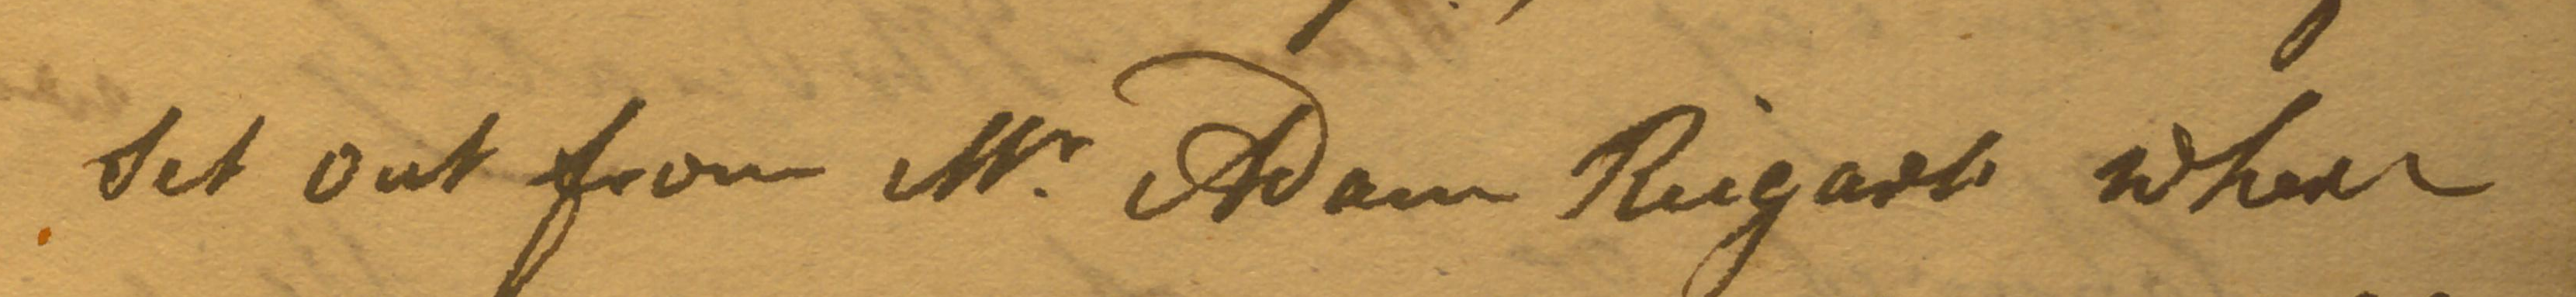set out from M^r. Adam Reigarb wher
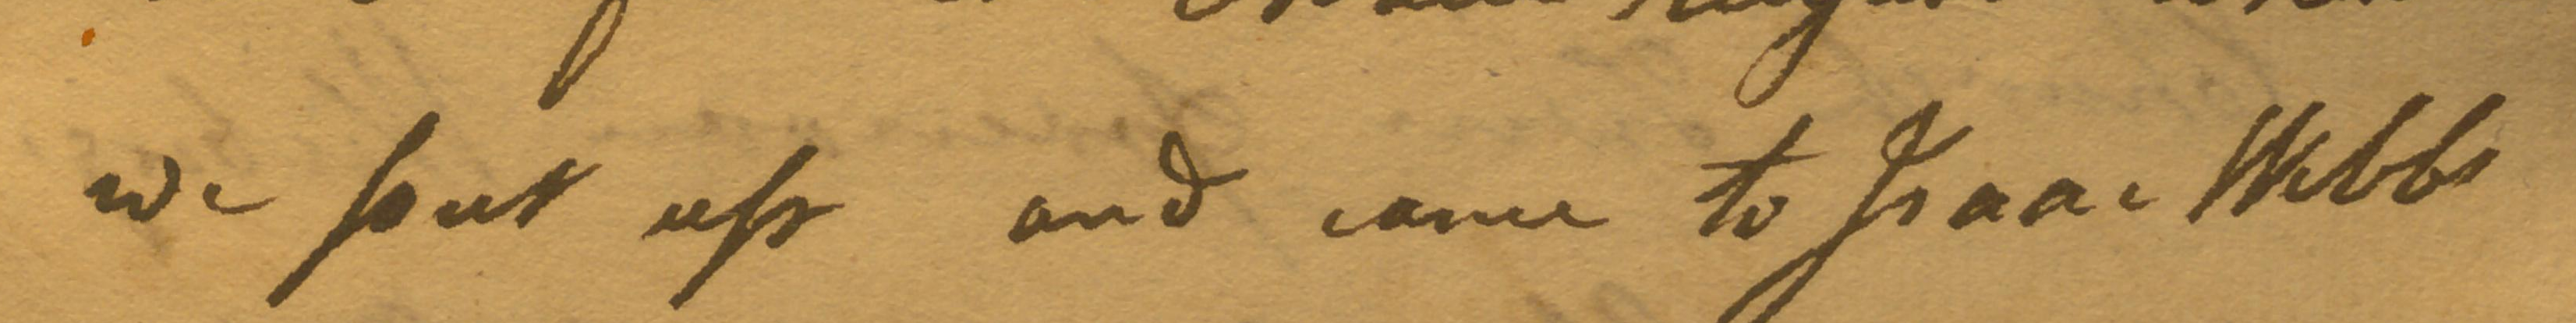we put up and came to Isaac Webbs
